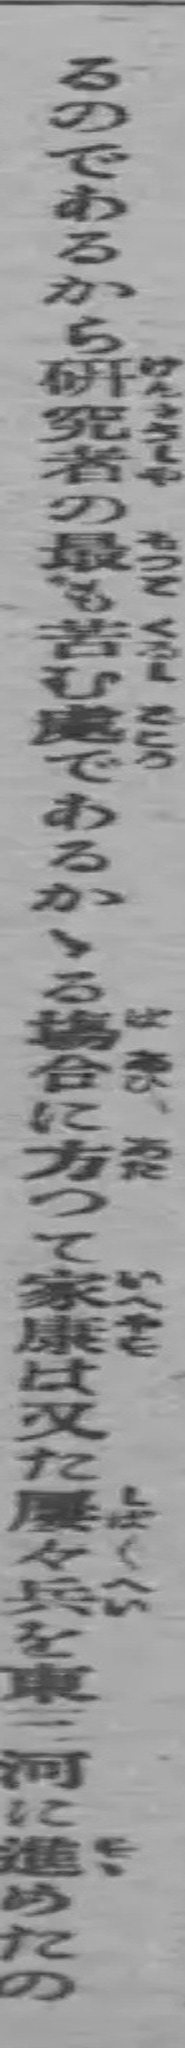るのであるから研究者の最も苦む処であるかゝる場合に方つて家康は又た屡々兵を東三河に進めたの
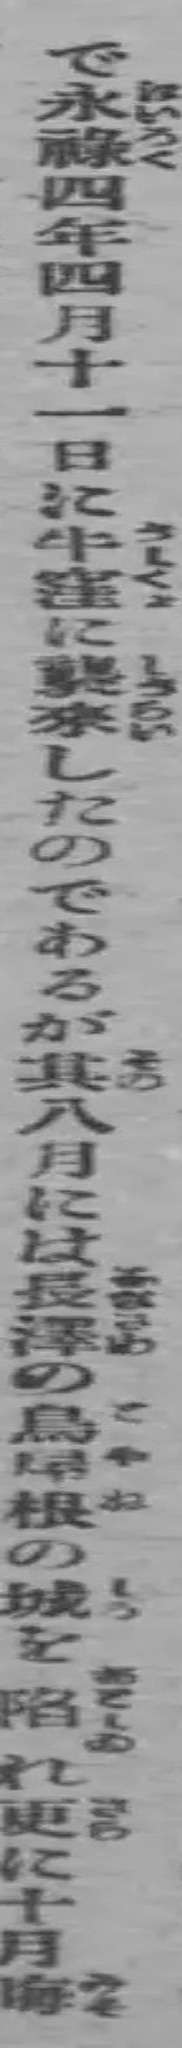鳥屋根の戦で永禄四年四月十一日に牛窪に襲来したのであるが其八月には長沢の鳥屋根の城を陥れ更に十月晦
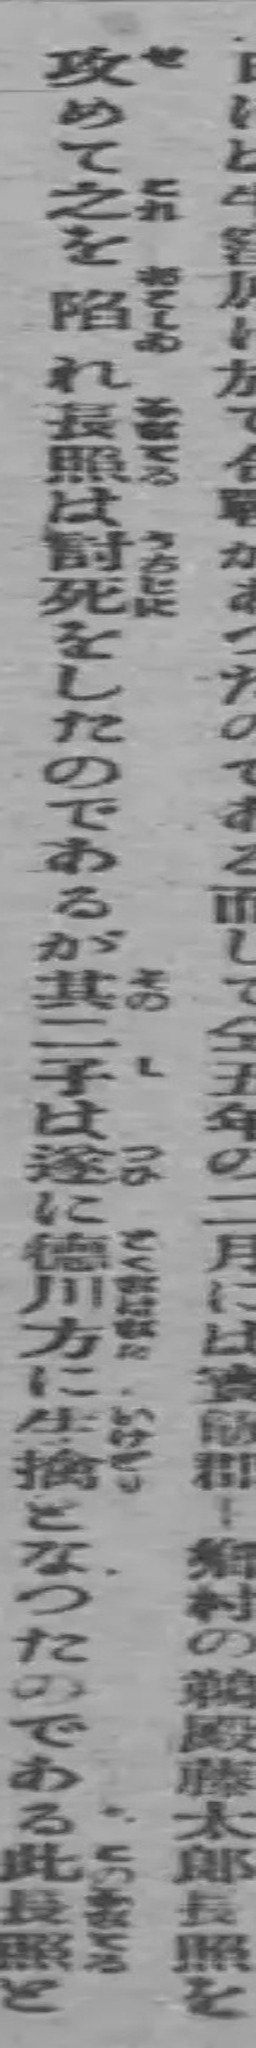攻めて之を陥れ長照は討死をしたのであるが其二子は遂に徳川方に生擒となつたのである此長照と
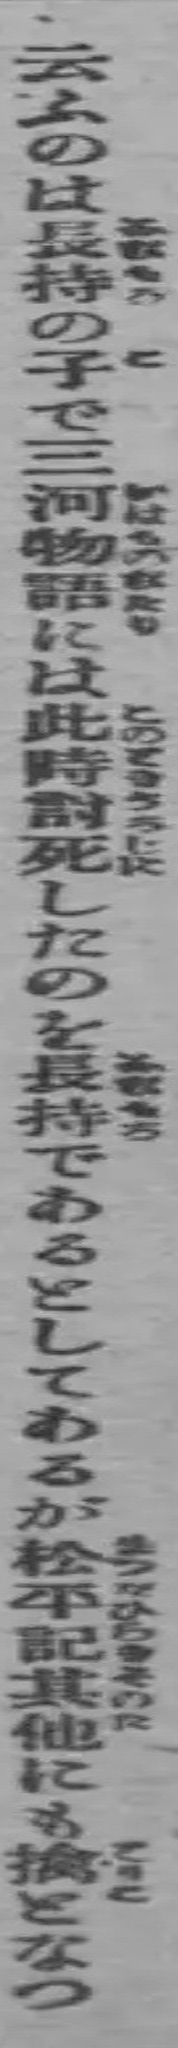云ふのは長持の子で三河物語には此時討死したのを長持であるとしてあるが松平記其他にも擒となつ
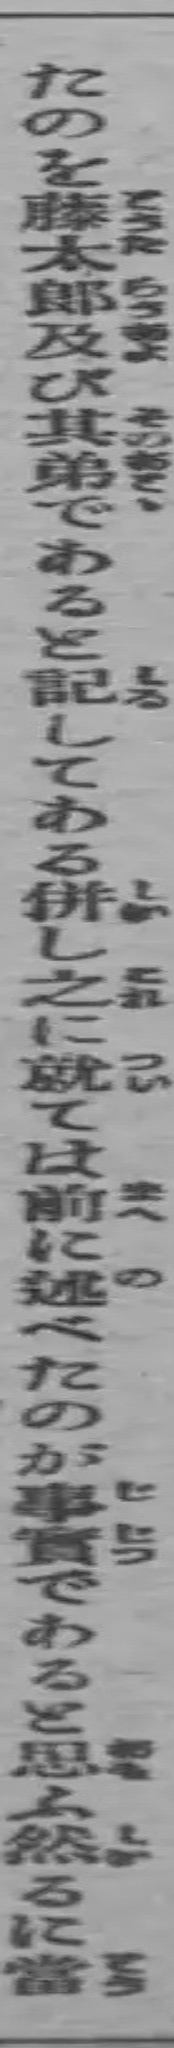たのを藤太郎及び其弟であると記してある併し之に就ては前に述べたのが事実であると思ふ然るに当
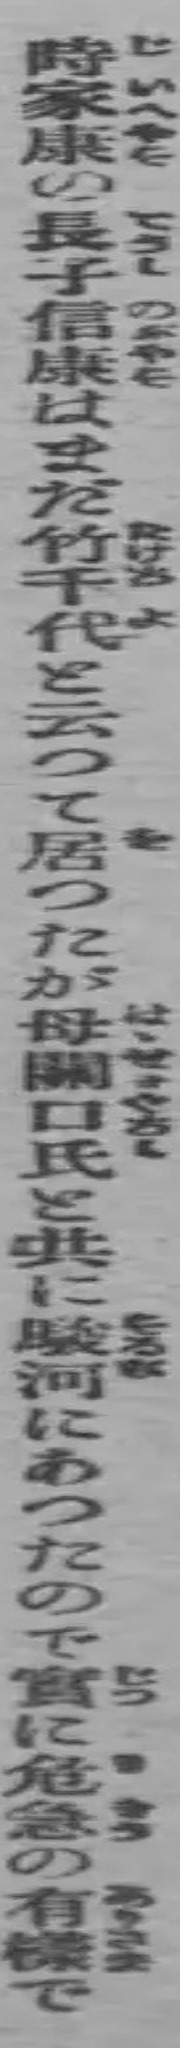時家康の長子の信康はまだ竹千代と云つて居つたが母関口氏と共に駿河にあつたので実に危急の有様で
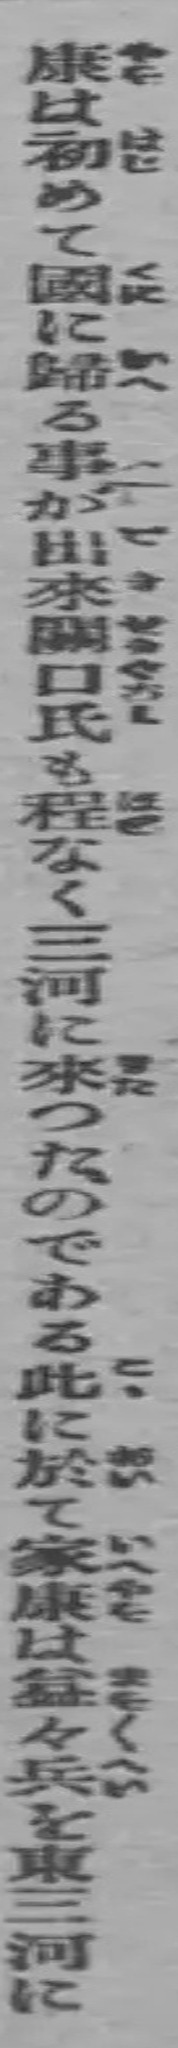康は初めて国に帰る事が出来関口氏も程なく三河に来つたのである此に於て家康は益々兵を東三河に
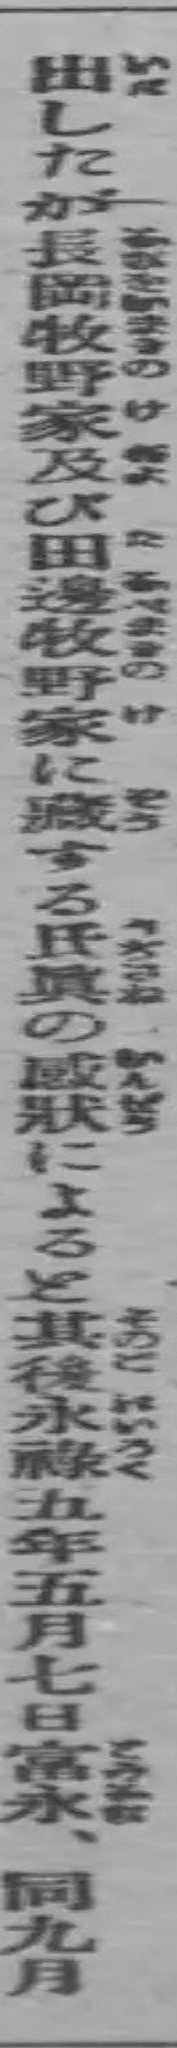出したが長岡牧野家及び田邉牧野家に蔵する氏真の感状によると其後永禄五年五月七日富永、同九月
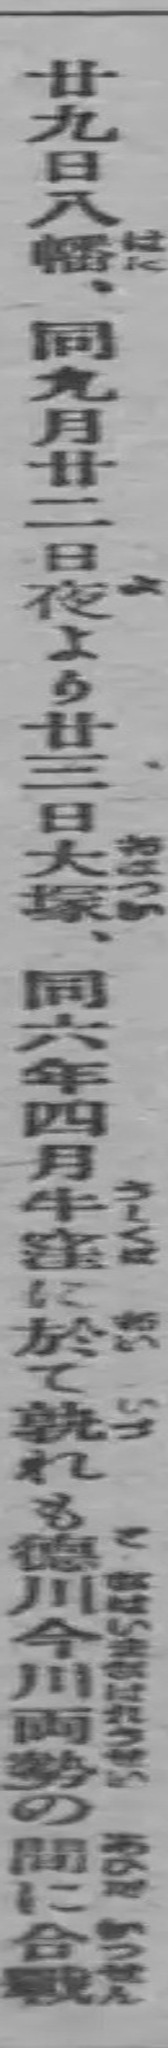廿九日八幡、同九月廿二日夜より廿三日大塚、同六年四月牛窪に於て孰れも徳川今川両勢の間に合戦
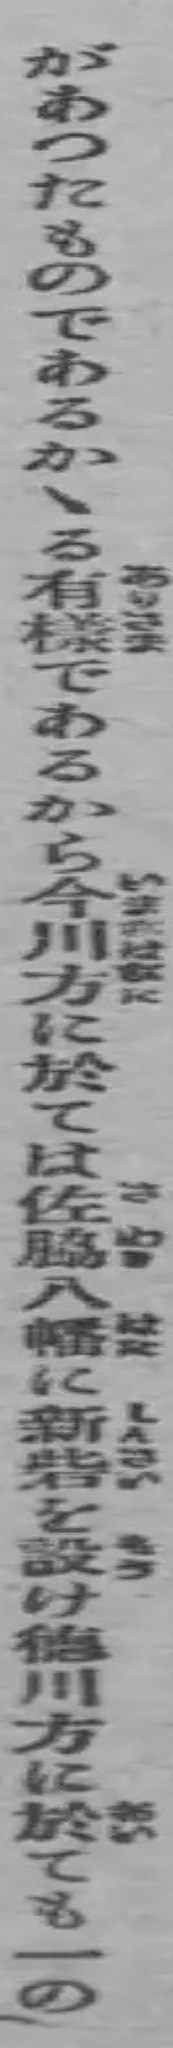があつたものであるかゝる有様であるから今川方に於ては佐脇八幡に新砦を設け徳川方に於ても一の
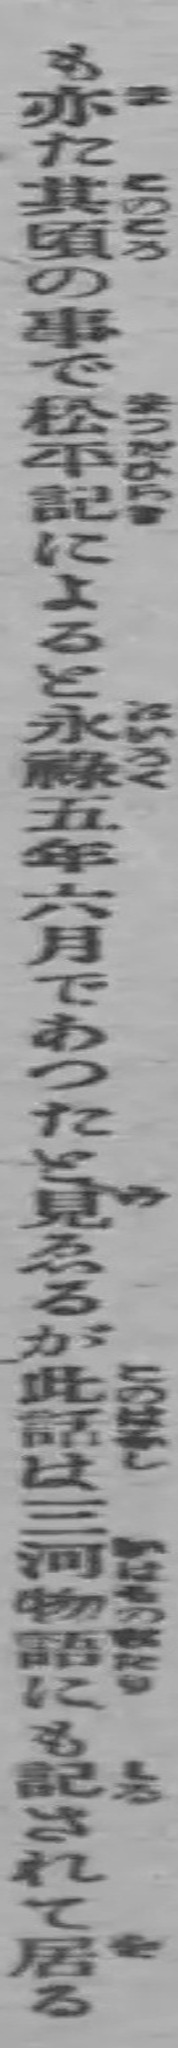も亦た其頃の事で松平記によると永禄五年六月であつたと見えるが此話は三河物語にも記されて居る
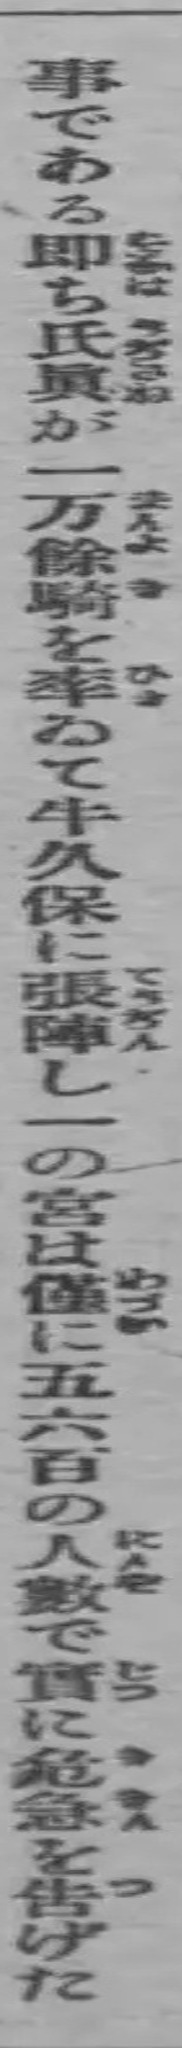事である即ち氏真が一万余騎を率ゐて牛久保に張陣し一の宮は僅に五六百の人数で実に危急を告げた
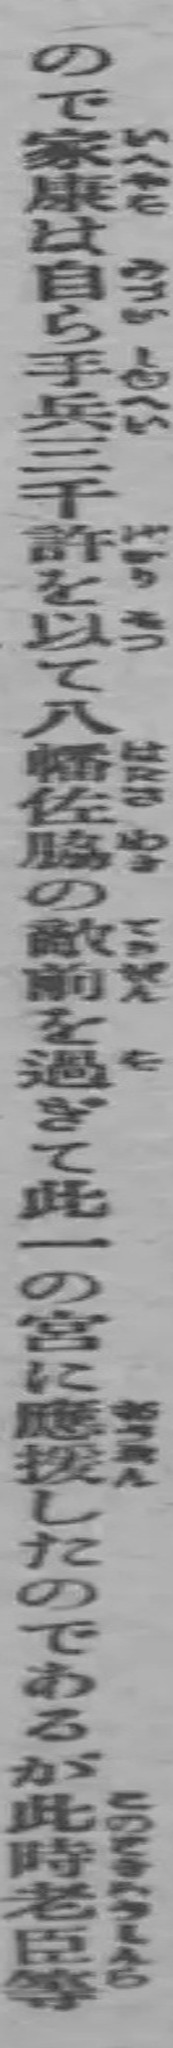ので家康は自ら手兵三千許を以て八幡佐脇の敵前を過ぎて此一の宮に応援したあるが此時老臣等
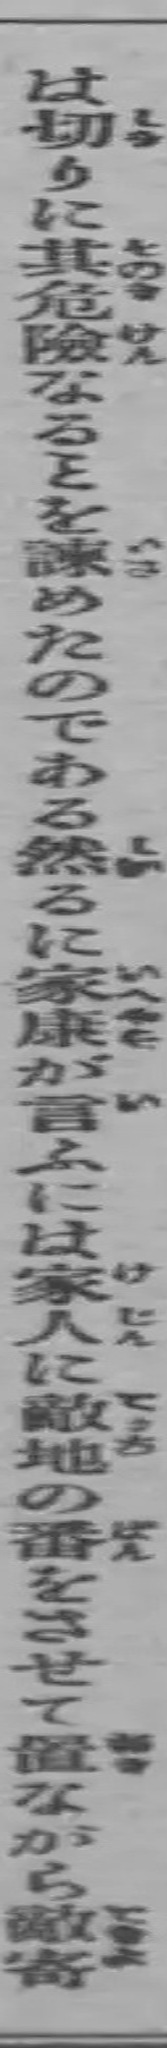は切りに其危険なることを諌めたのである然るに家康が言ふには家人に敵地の番をさせて置ながら敵寄
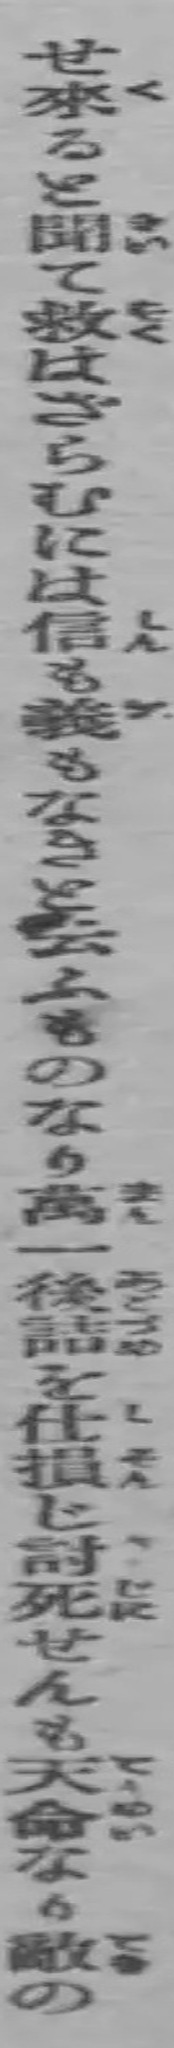せ来ると聞て救はざらむには信も義もなきと云ふものなり万一後詰を仕損じ討死せんも天命なり適の
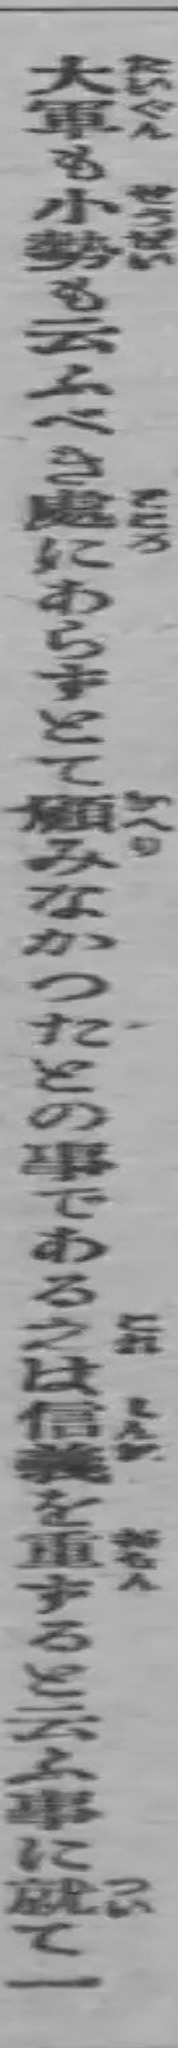大軍も小勢も云ふべき処にあらずとて顧みなかつたとの事である之は信義を重ずると云ふ事に就て一
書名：豊橋市史談
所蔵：国立国会図書館 National Diet Library, JAPAN
